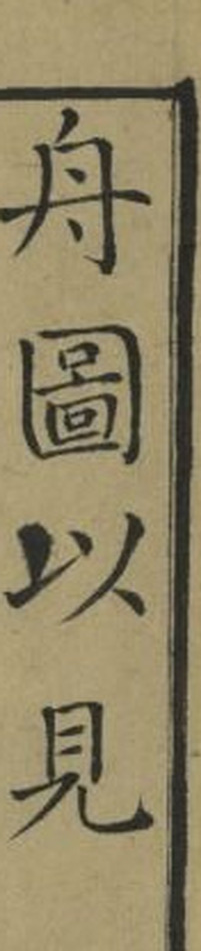舟圖以見
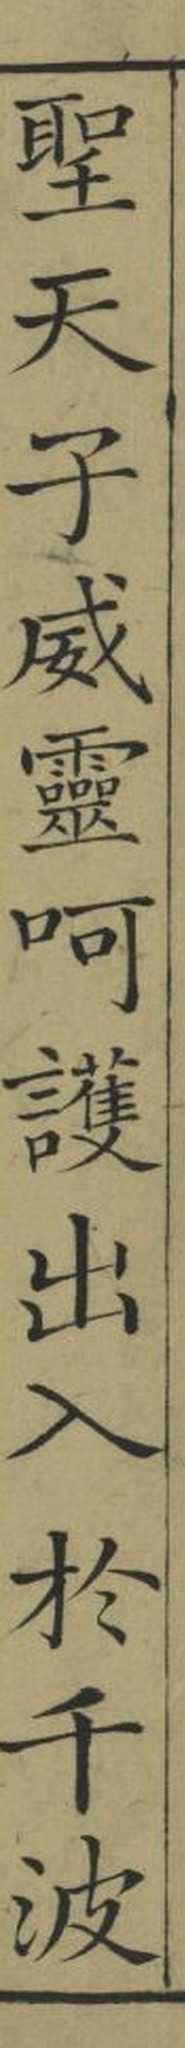聖天子威靈呵護出入扵千波
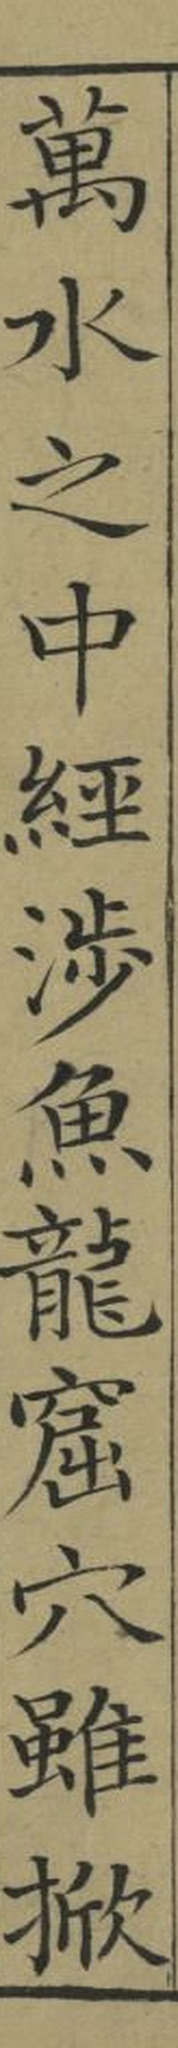萬水之中經渉魚龍窟穴雖掀
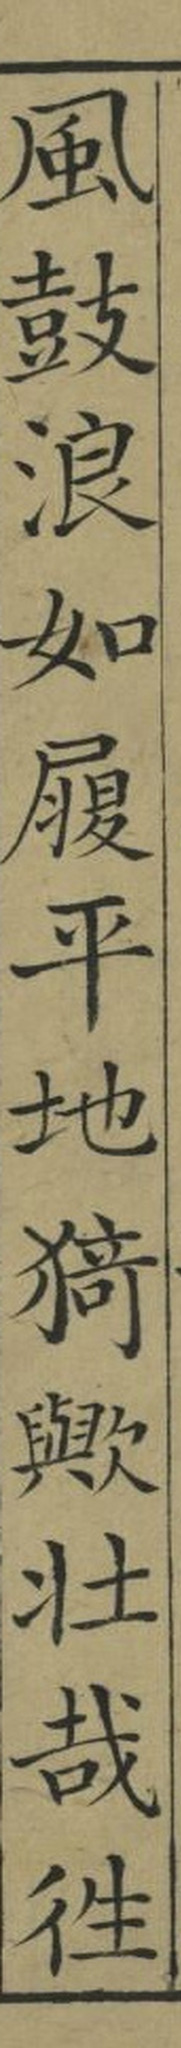風鼓浪如履平地猗歟壮哉徃
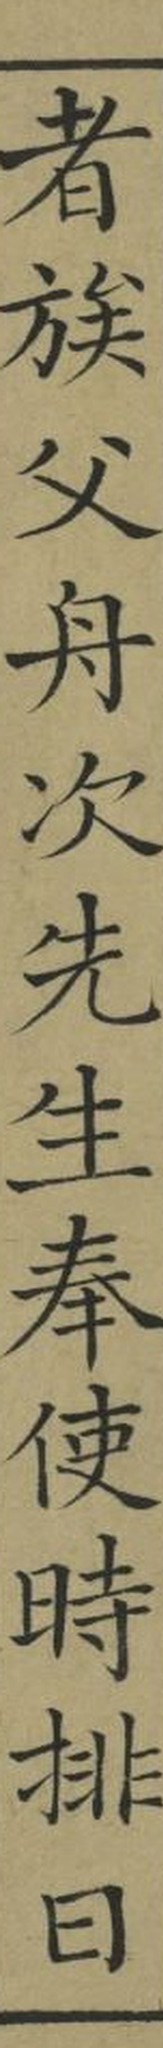者族父舟次先生奉使時排日
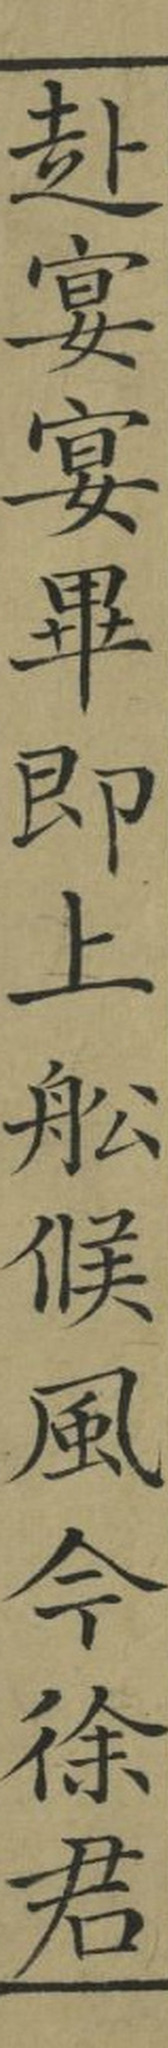赴宴宴畢即上舩候風今徐君
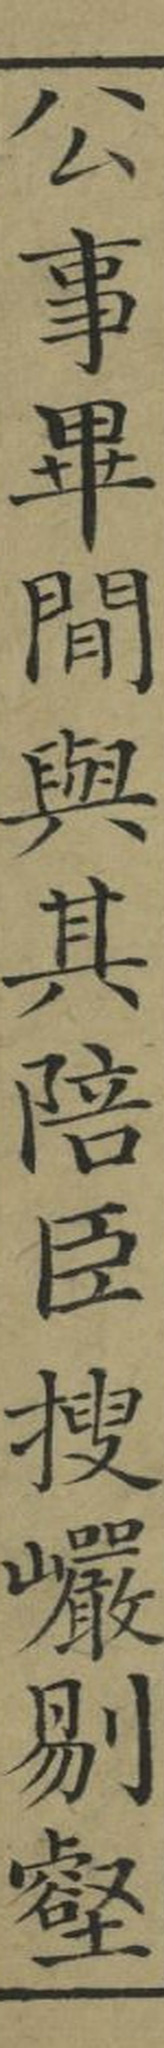公事畢閒與其陪臣搜巗剔壑
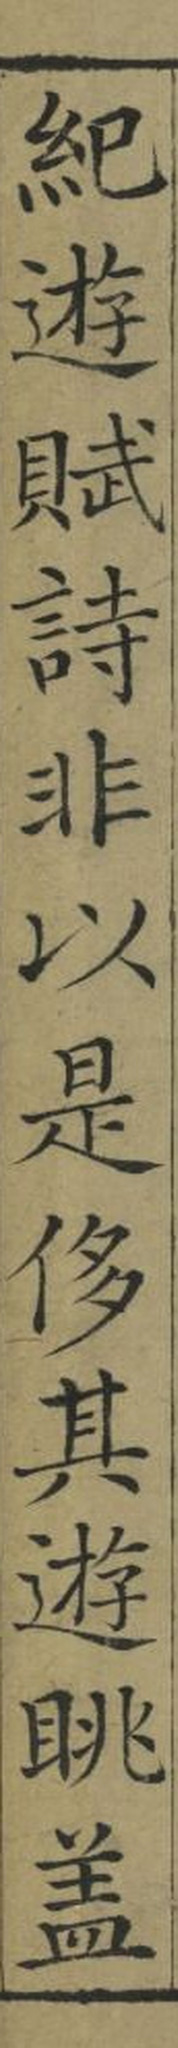紀逰賦詩非以是侈其逰眺盖

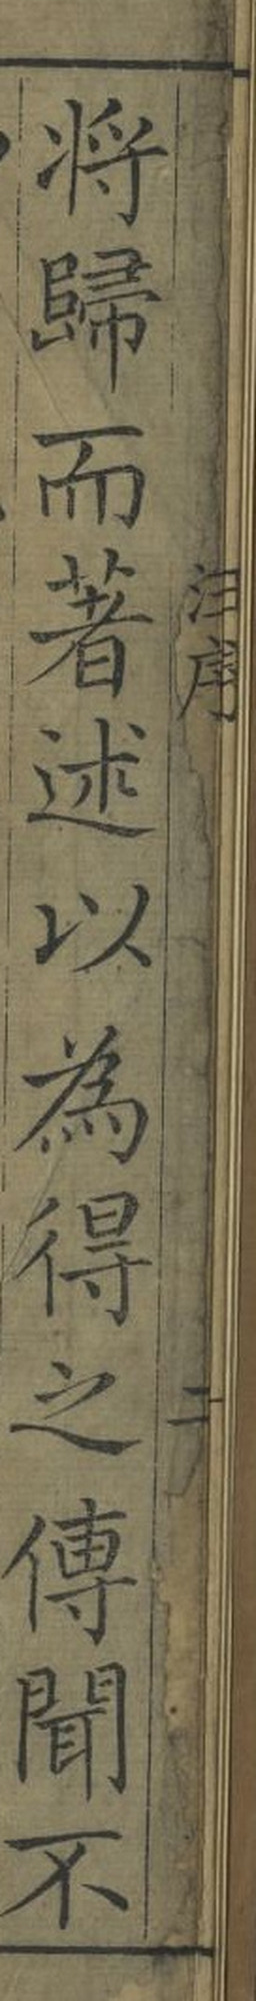将歸而著述以為得之傳聞不
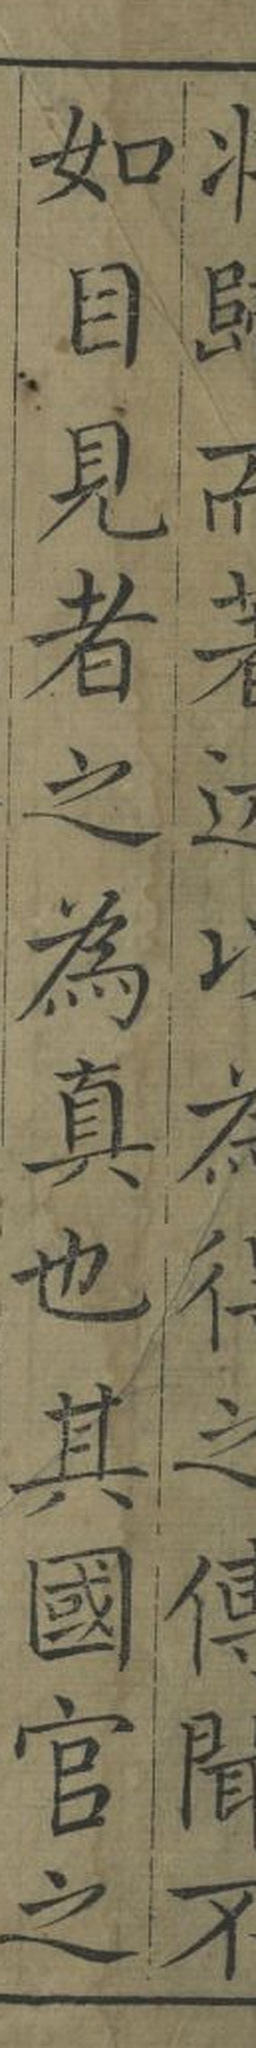如目見者之為真也其國官之
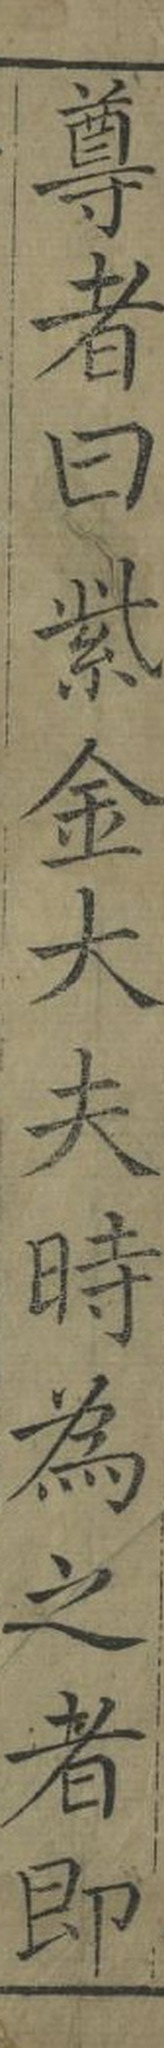尊者曰紫金大夫時為之者即
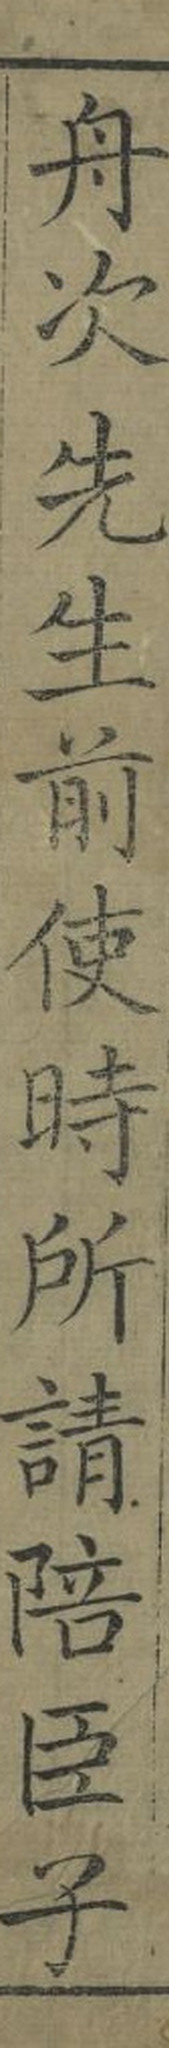舟次先生前使時所請陪臣子
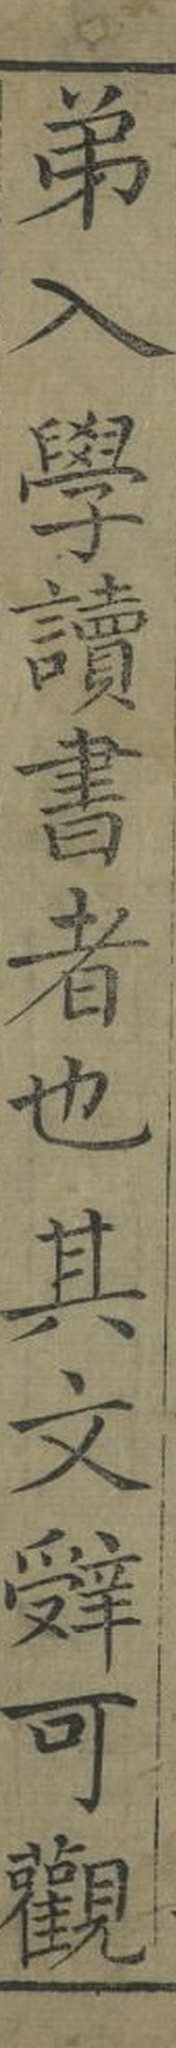弟入學讀書者也其文辤可觀
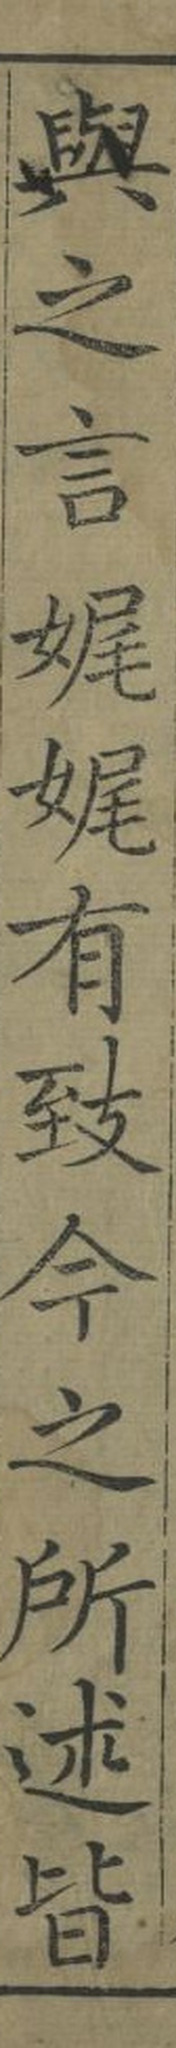與之言娓娓有致今之所述皆
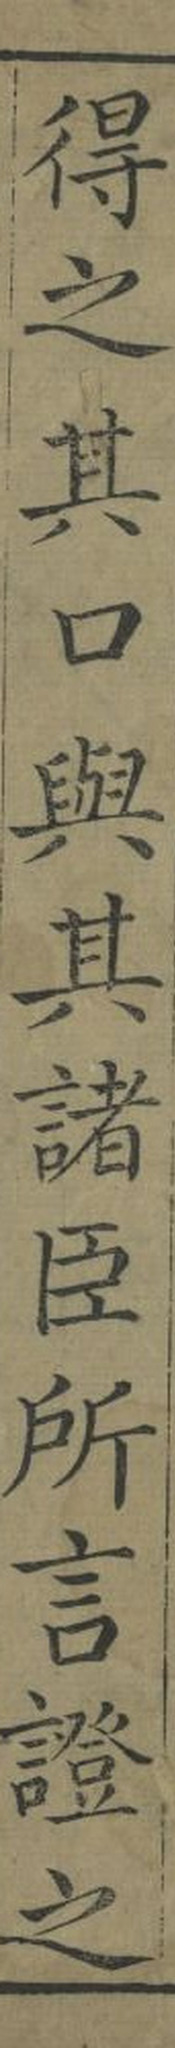得之其口與其諸臣所言證之
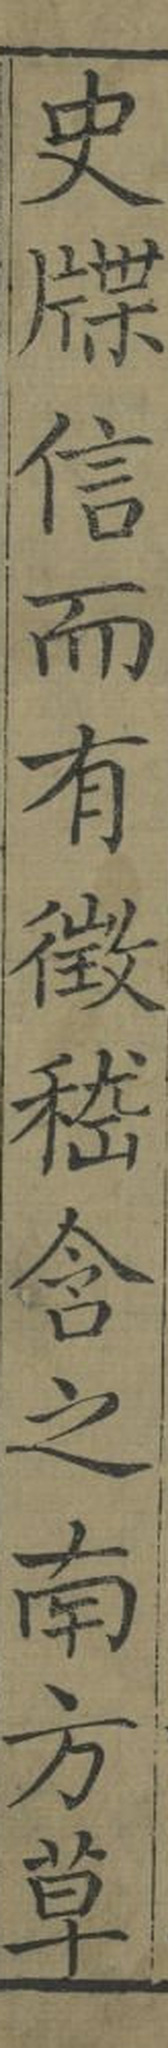史牒信而有徴嵇含之南方草
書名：中山伝信録 巻一
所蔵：University of the Ryukyus Library
